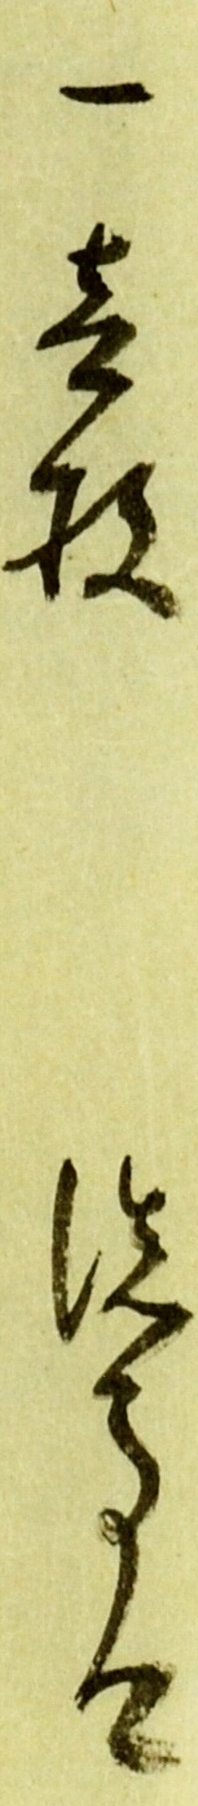一壱枚洗馬郷
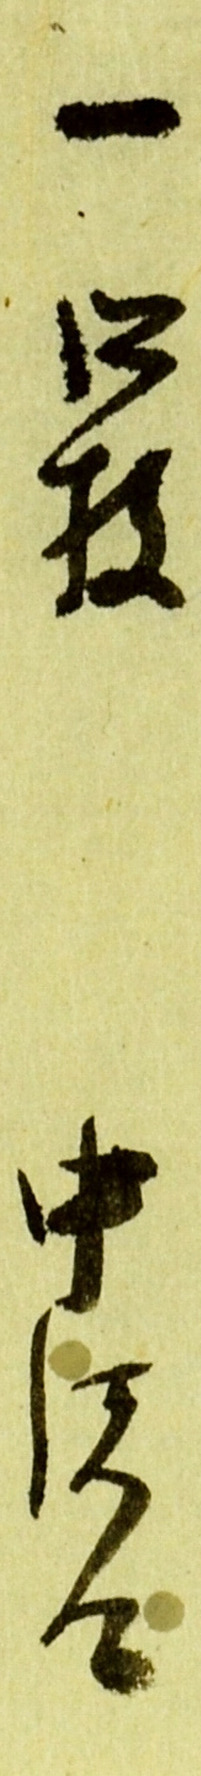一四枚中沢郷
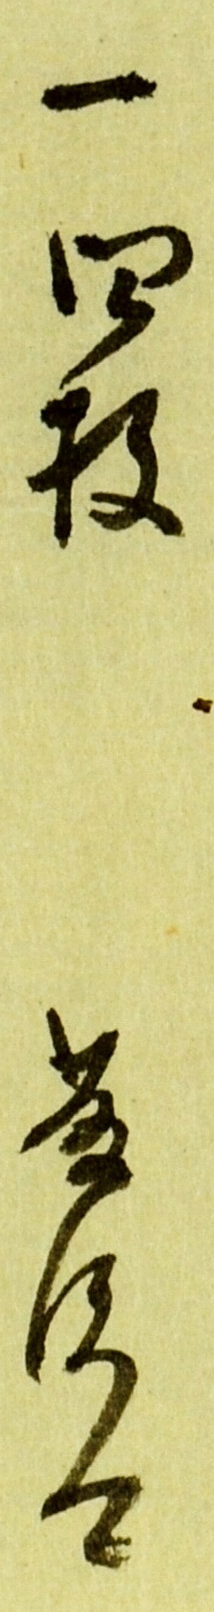一四枚藤沢郷
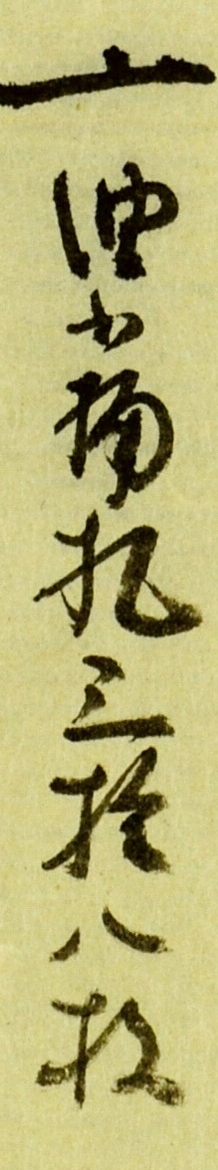〆油小桶札三拾八枚
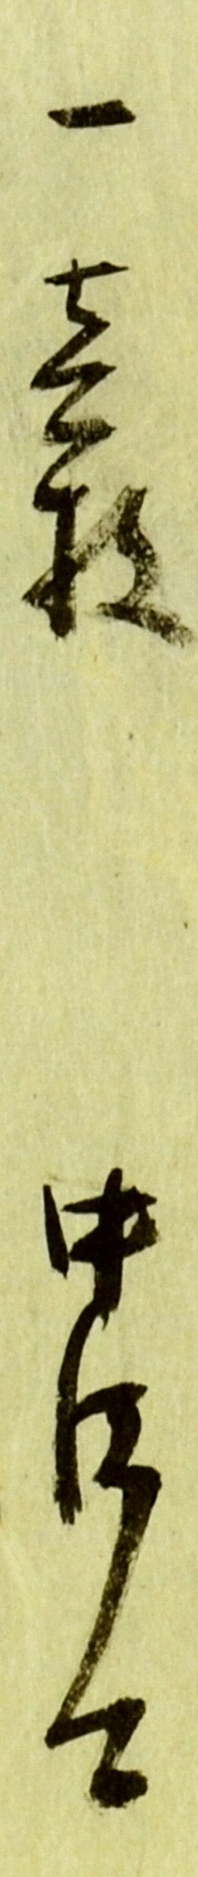一壱枚中沢郷
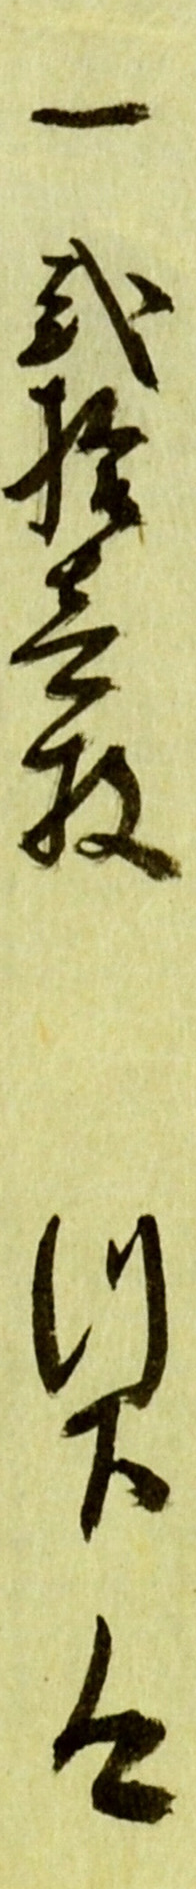一弐拾壱枚川下郷
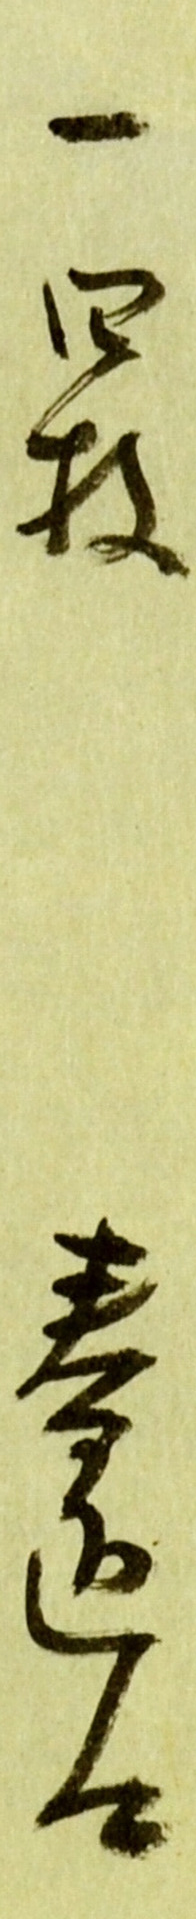一四枚春近郷
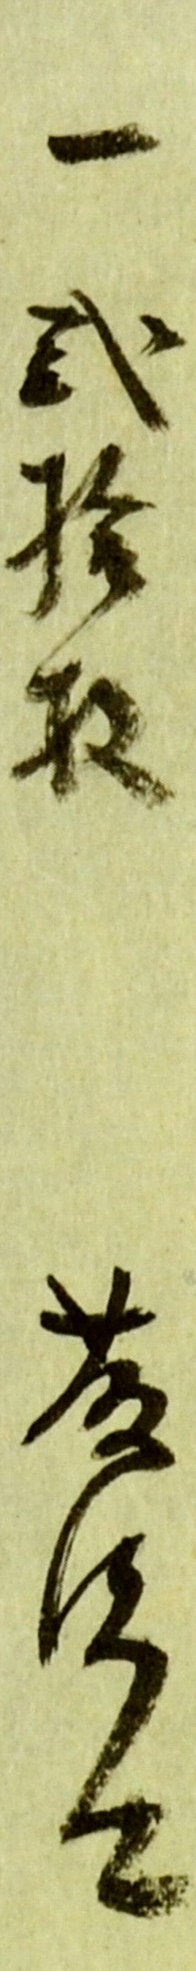一弐拾枚藤沢郷
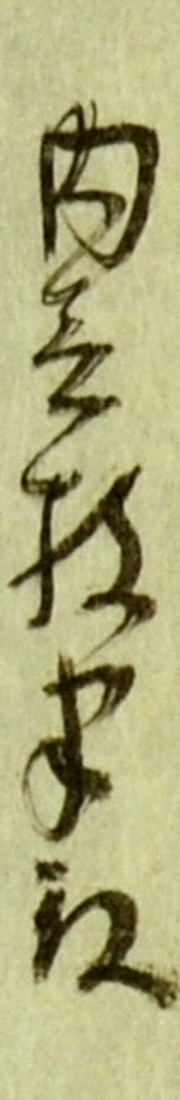内壱枚半役

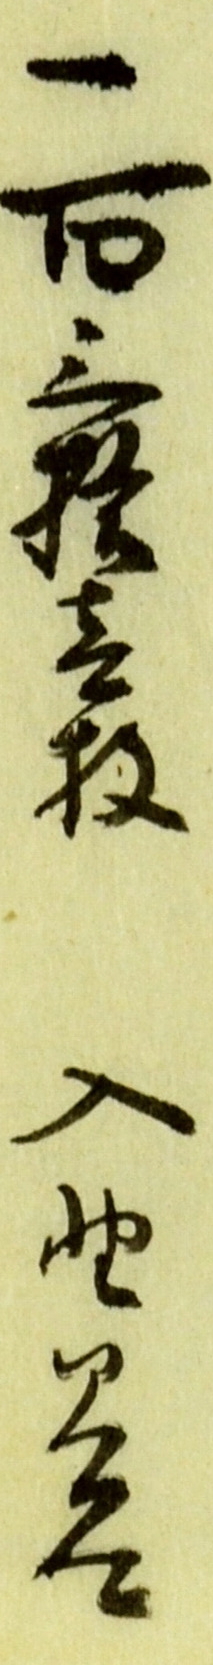一百三拾壱枚入野谷郷
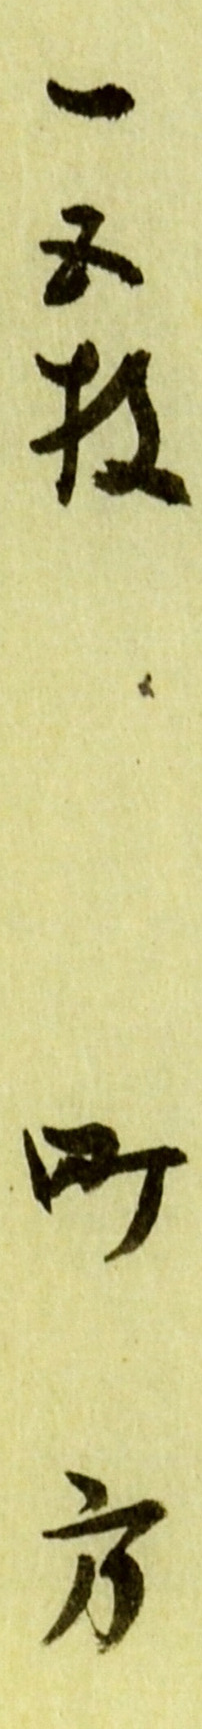一五枚町方
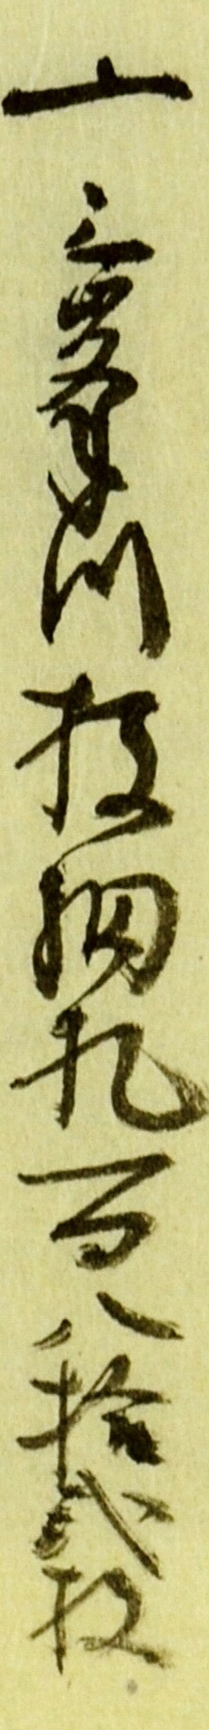〆三峰川投網札百八拾弐枚
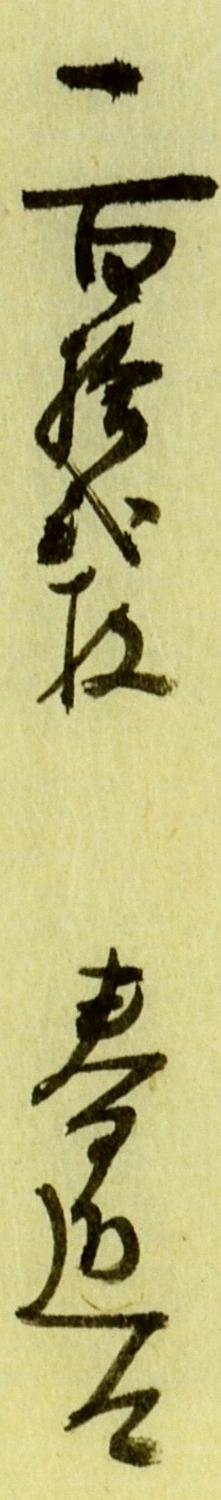一百拾弐枚春近郷
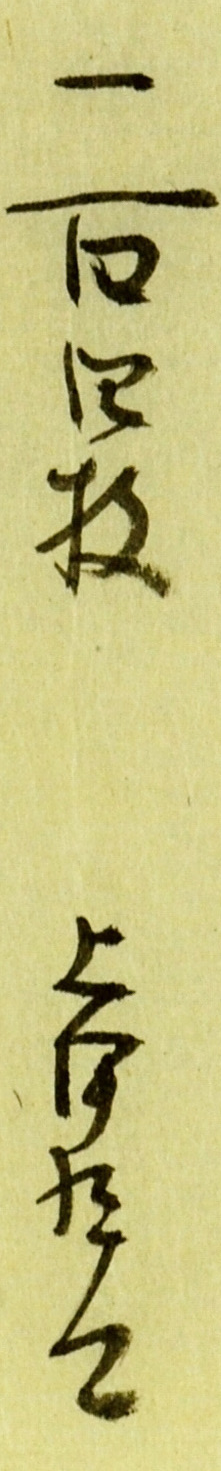一百四枚上伊那郷
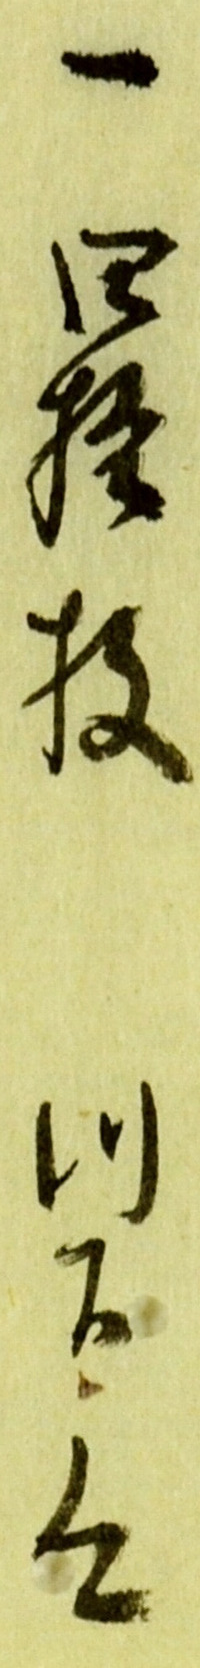一四拾枚川下郷
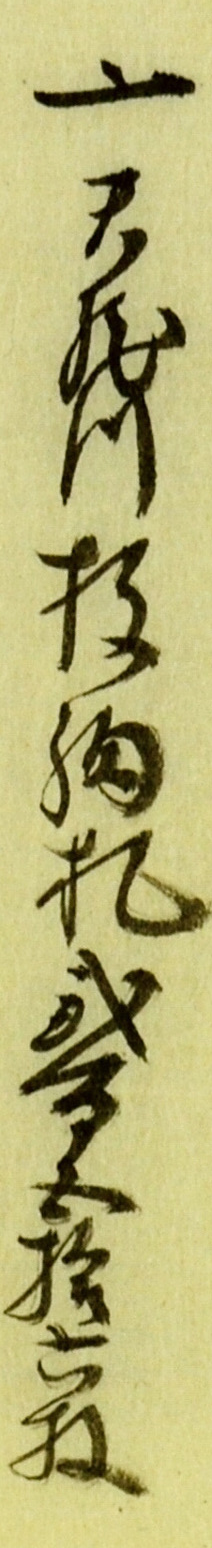〆天龍川投網札弐百五拾六枚
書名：午年諸郷并町方鑑札渡覚
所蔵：伊那市立高遠町図書館・合同会社AMANE
